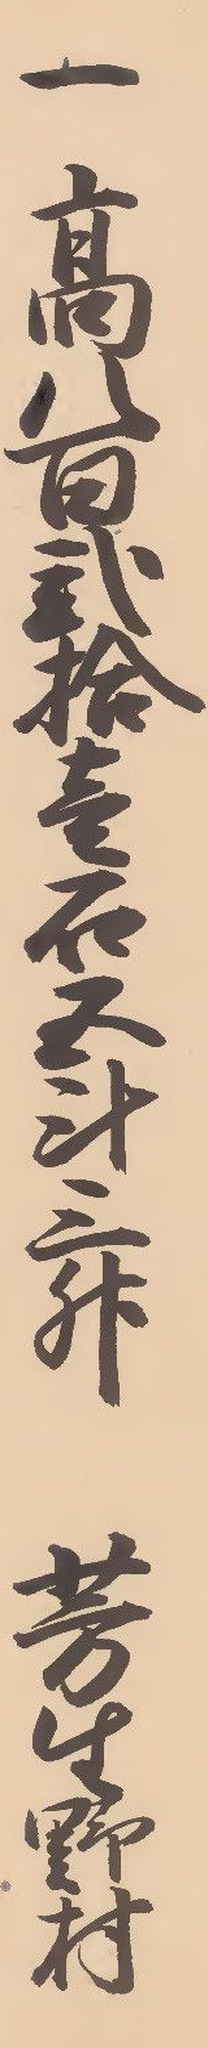一髙八百弐拾壱石五斗三升芳生野村
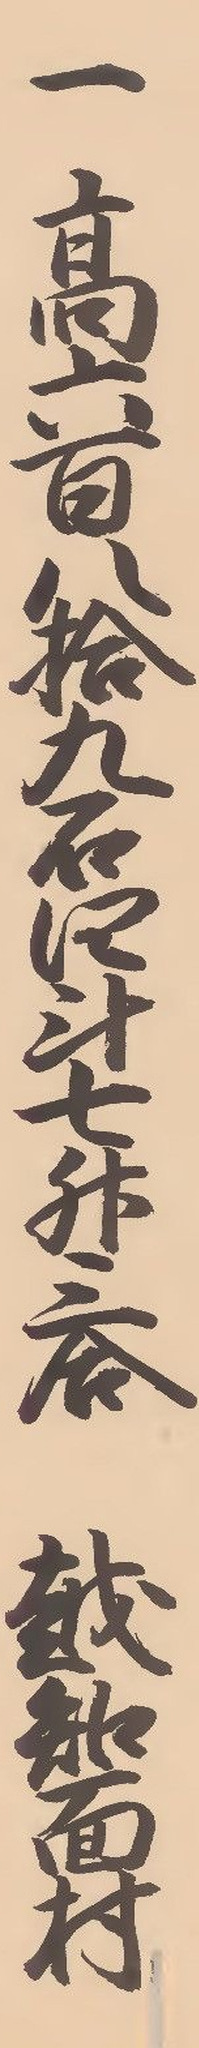一髙六百八拾九石四斗七升三合越知面村
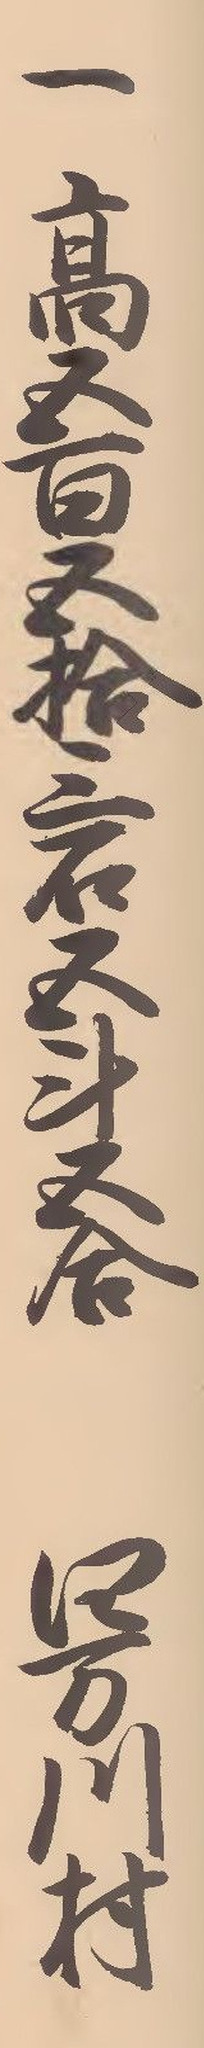一髙五百五拾三石五斗五合四万川村
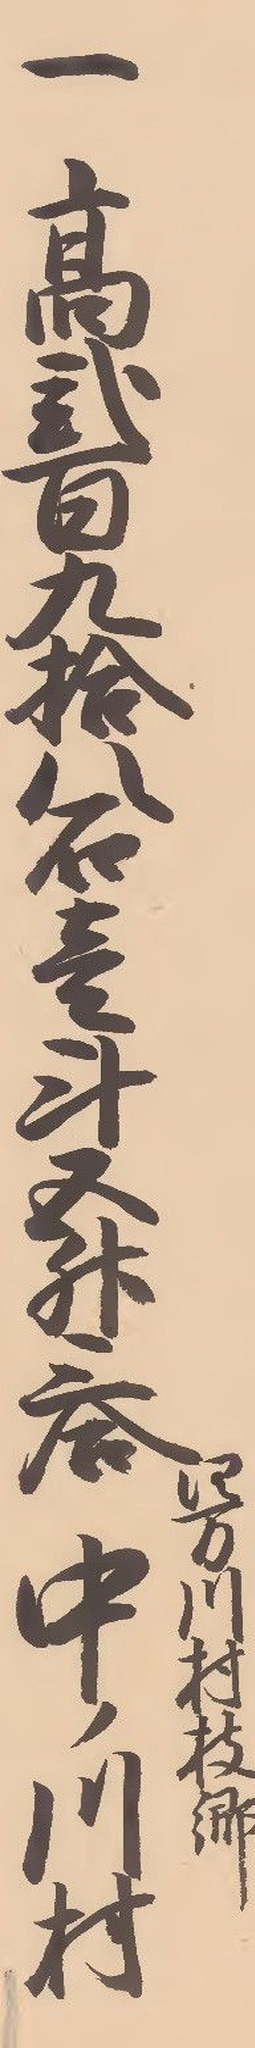一髙弐百九拾八石壱斗五升三合中ノ川村
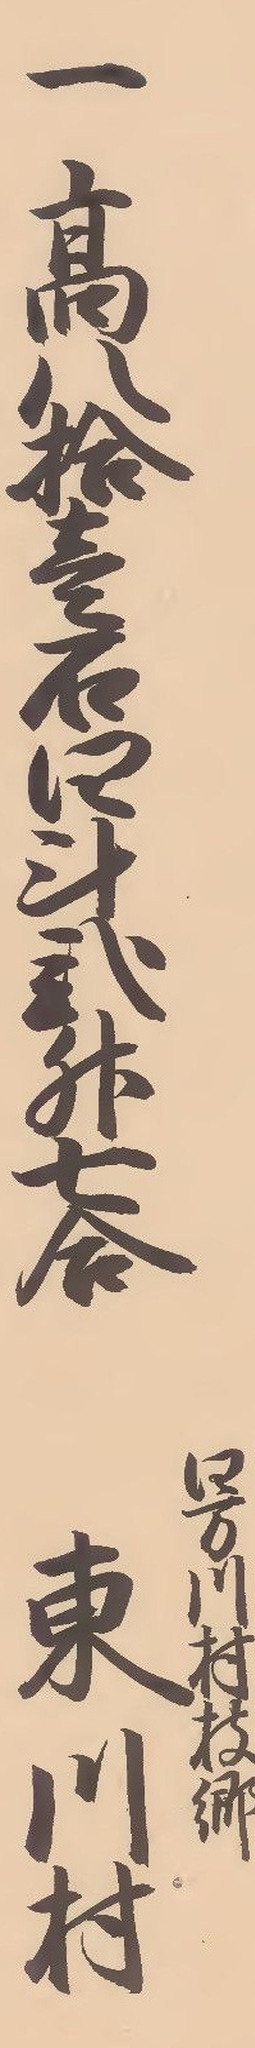一髙八拾壱石四斗弐升七合東川村
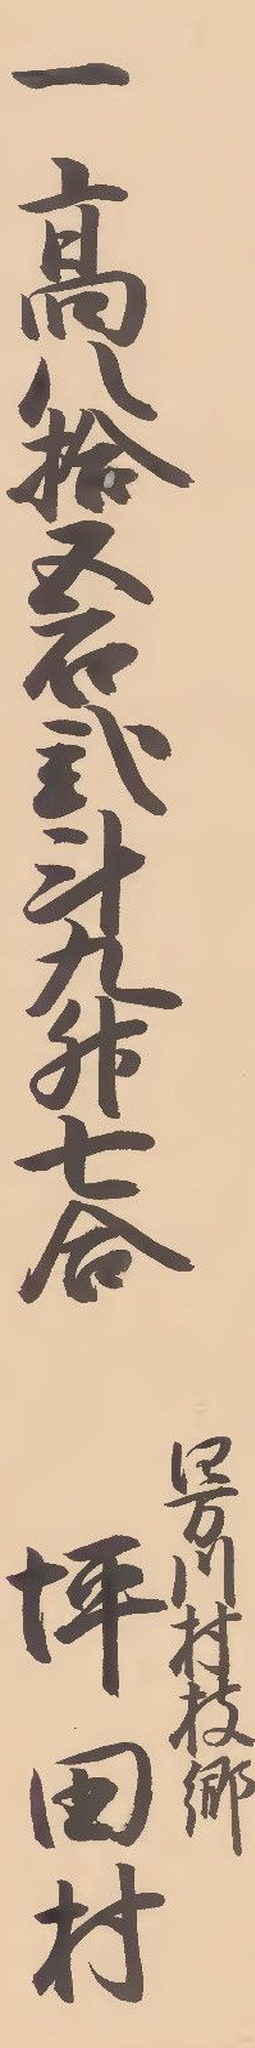一髙八拾五石弐斗九升七合坪田村

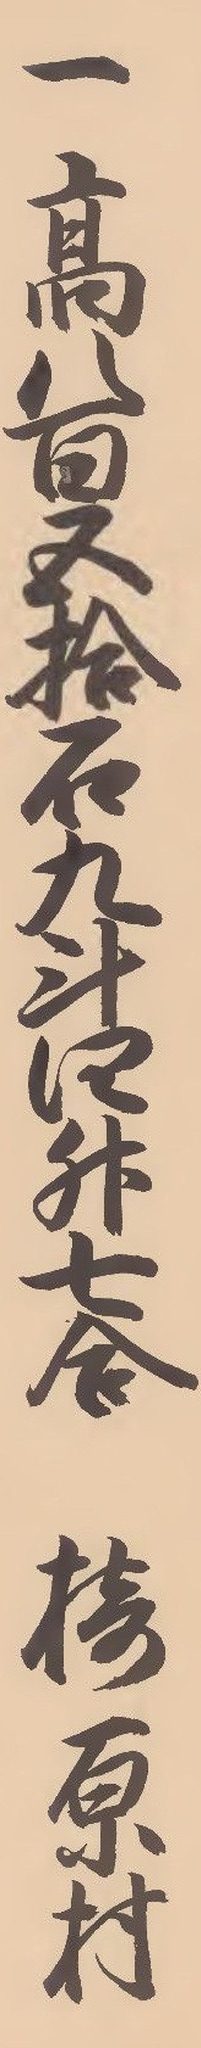一髙八百五拾石九斗四升七合原村
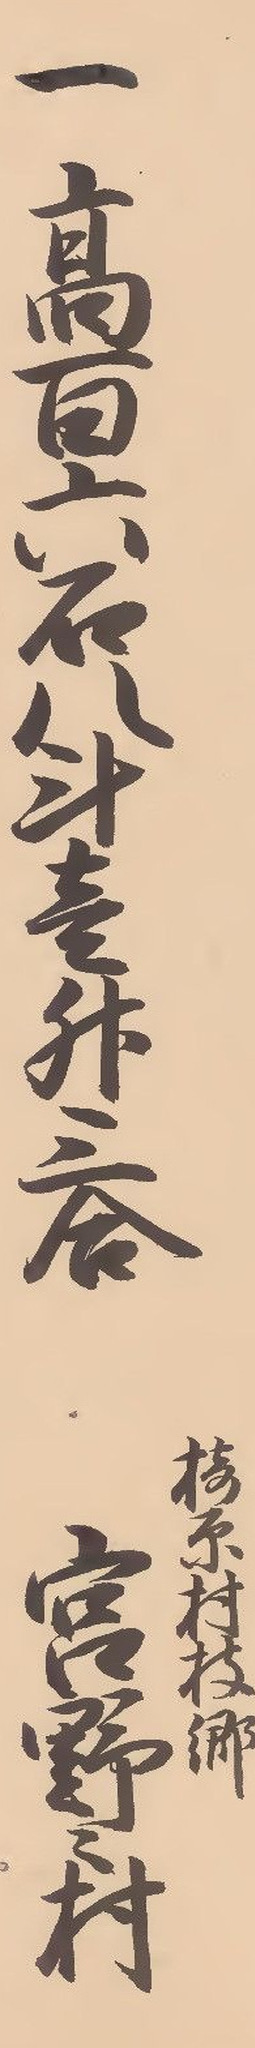一髙百六石八斗壱升三合宮野々村
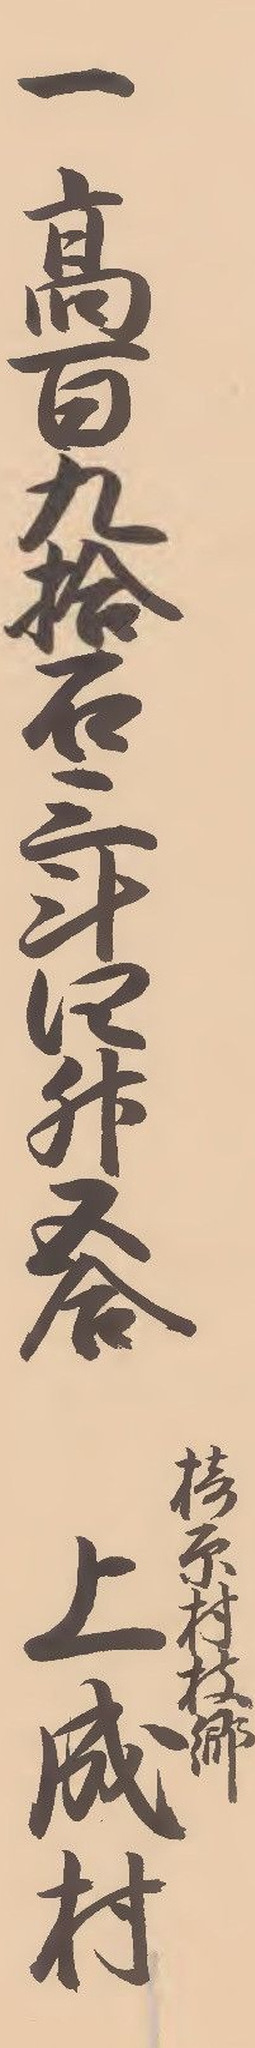一髙百九拾石三斗四升五合上成村
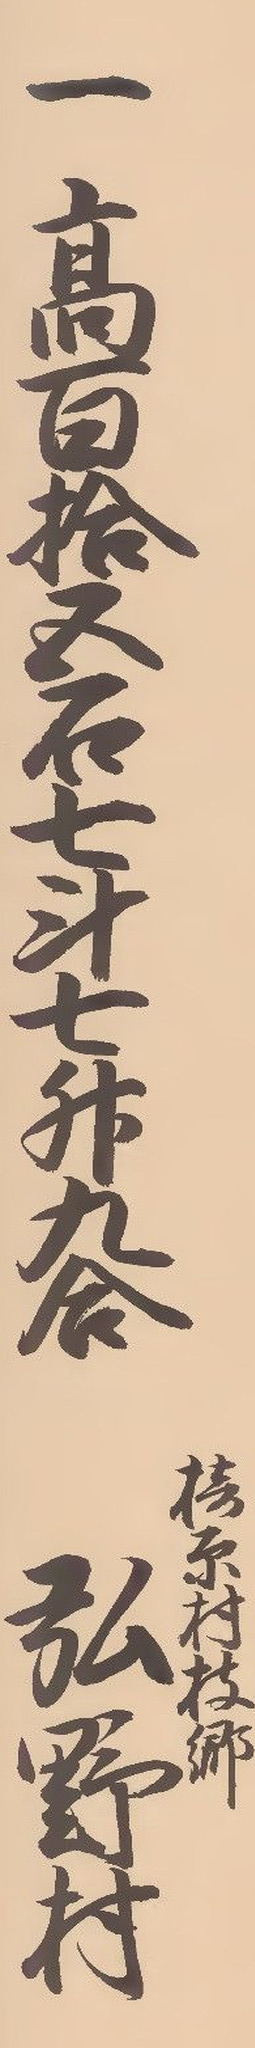一髙百拾五石七斗七升九合弘野村
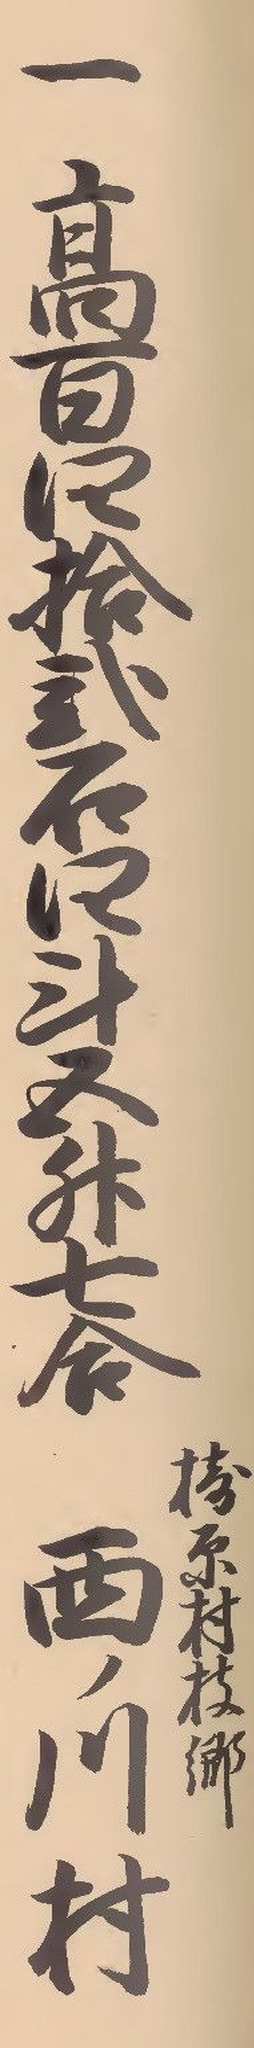一髙百四拾弐石四斗五升七合西ノ川村
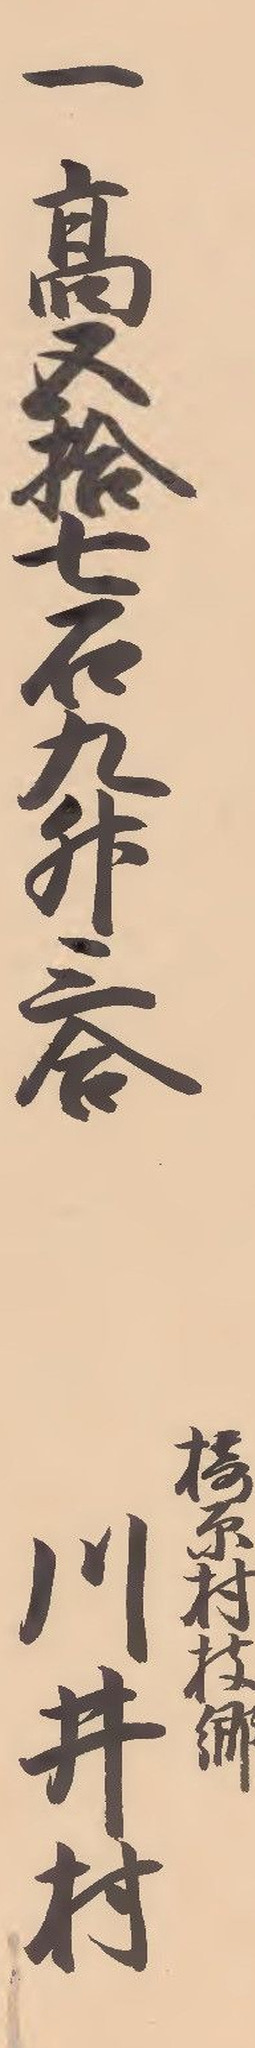一髙五拾七石九升三合川井村
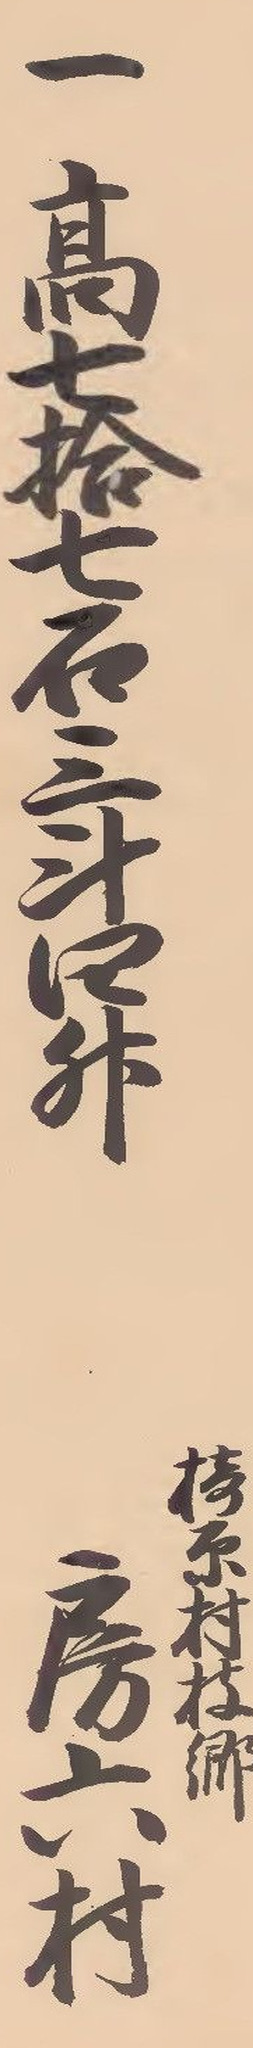一髙七拾七石三升四升房六村

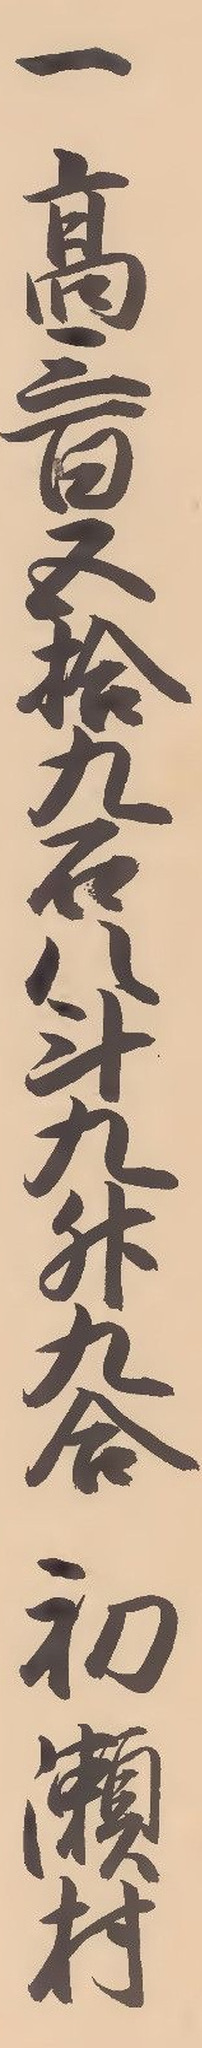一髙三百五拾九石八斗九升九合初瀬村
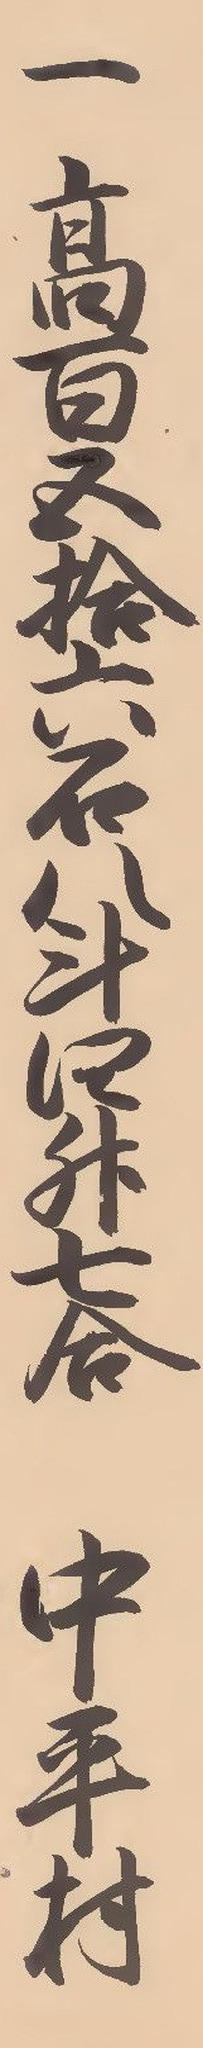一髙百五拾六石八斗四升七合中平村
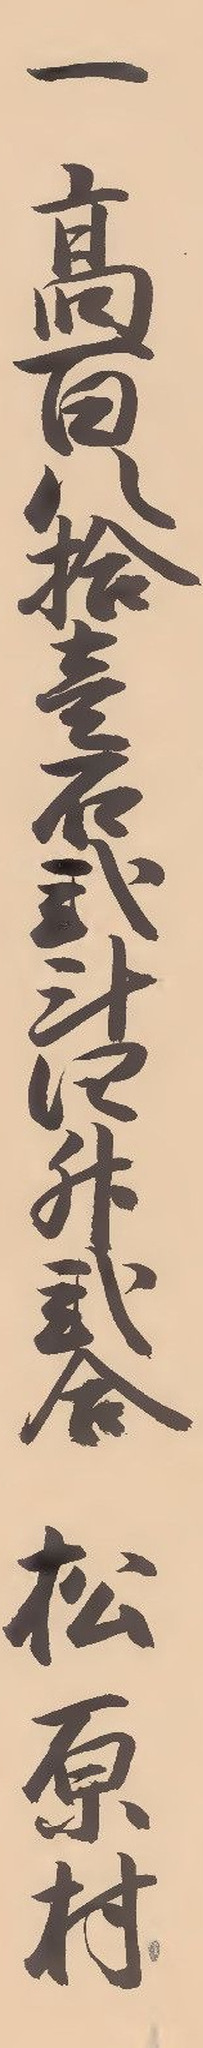一髙百八拾壱石弐斗四升弐合松原村
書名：土佐国郷帳
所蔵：国立公文書館 National Archives of Japan
